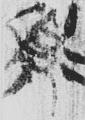○（寡）
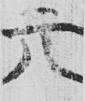亓
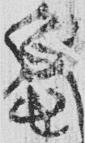○（憂）
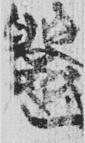○（與）
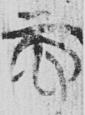而
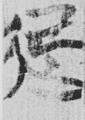○（起）
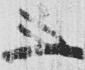之
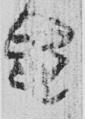思
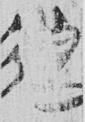○（顛）
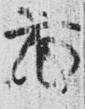而
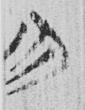勿
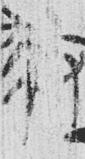救
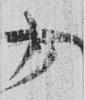方
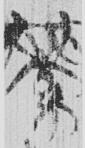縈（營）
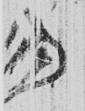勿
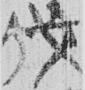伐
